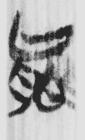能
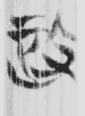政
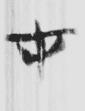才
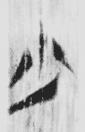少
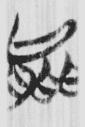能
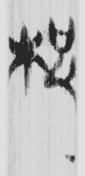枳
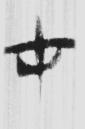才
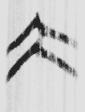大
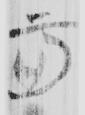可
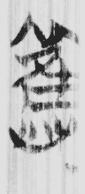舊
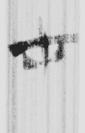才
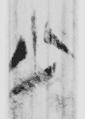少
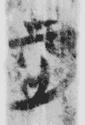可
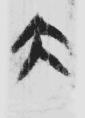大
